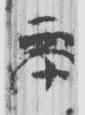不
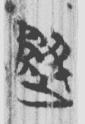{阜夊止}
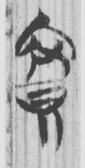{府貝}
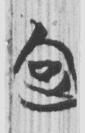定
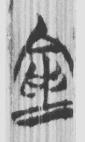倉
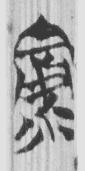{宀录}
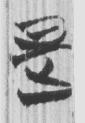是
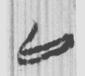㠯（以）
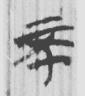不
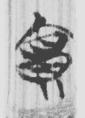實
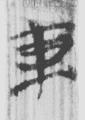車
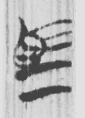馬
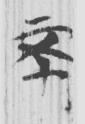不
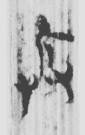兵
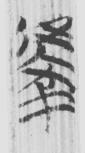{虍㚔}
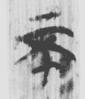不
